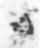紫
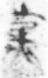黃
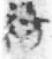紡
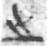之
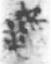○（鞍）
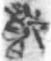○（豻）
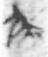尾
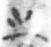之
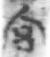宮
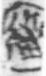○（廏）
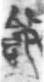○（令）
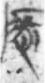所
